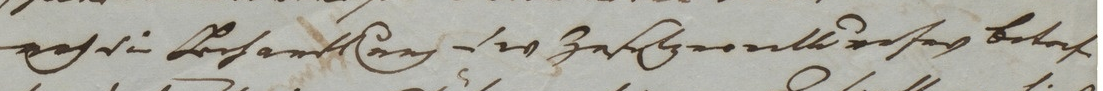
noch die Behandlung des Gesetzesentwurfes betref-
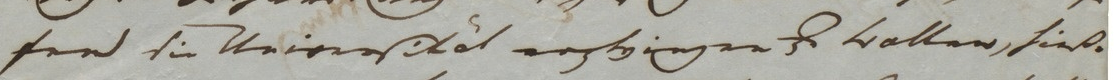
fend die Universität erzwingen zu wollen, hieße
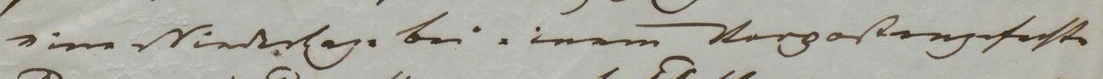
eine Niederlage bei einem Vorpostengefechte
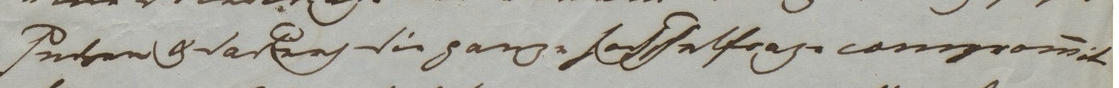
suchen & dadurch die ganze Hochschulfrage comprommit-
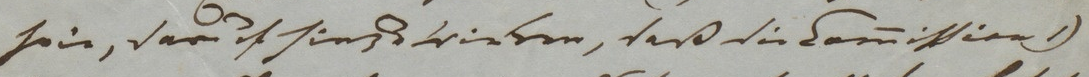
sein, darauf hinzuwirken, daß die Commission 1)
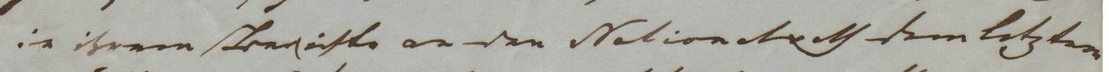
in ihrem Berichte an den Nationalrath dem letztern
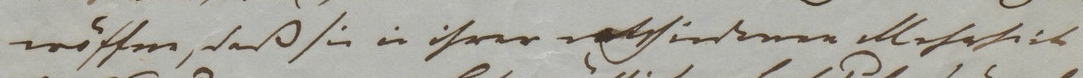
eröffne, daß sie in ihrer entschiedenen Mehrheit
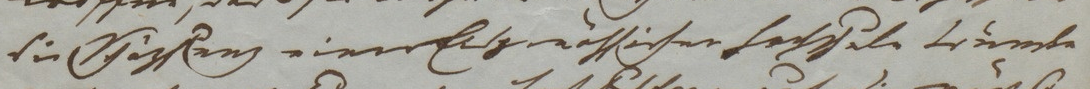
die Schöpfung einer Eidgenössischen Hochschule wünsche
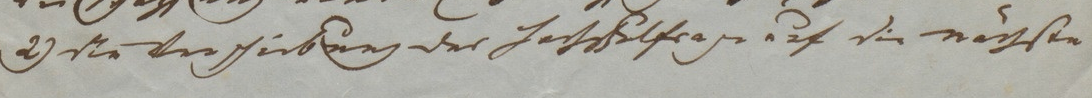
2) die Verschiebung der Hochschulfrage auf die nächste
